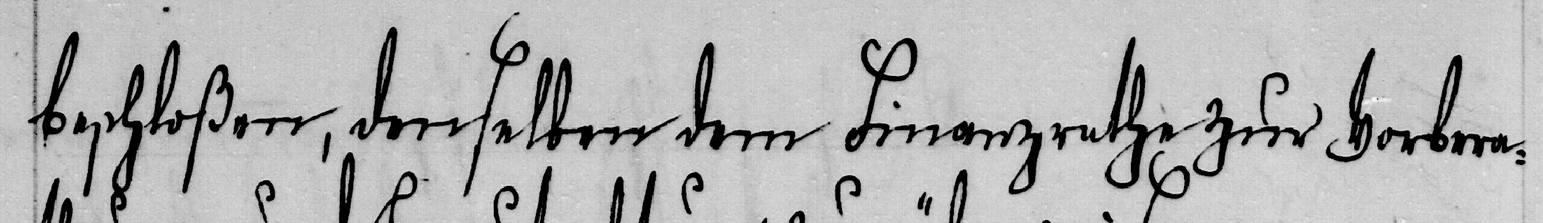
beschloßen, denselben dem Finanzrathe zur Vorber¬
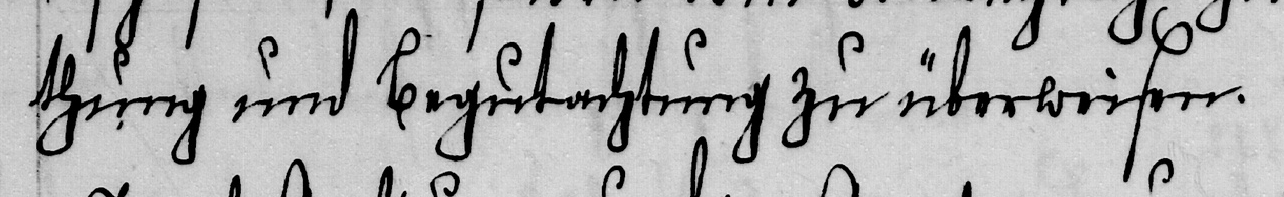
athung und Begutachtung zu überweisen.
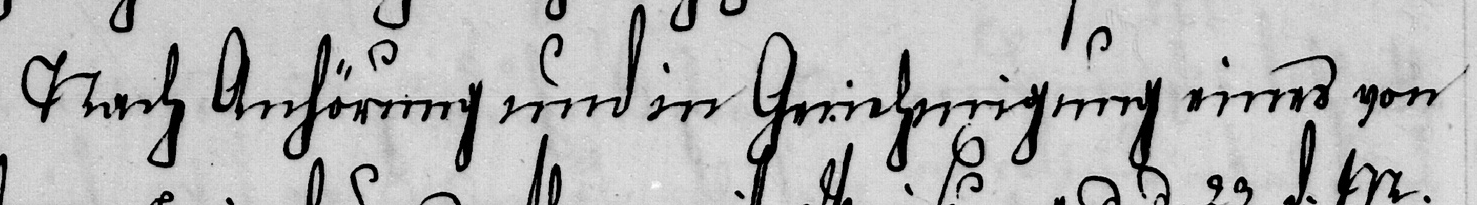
Nach Anhörung und in Genehmigung eines von
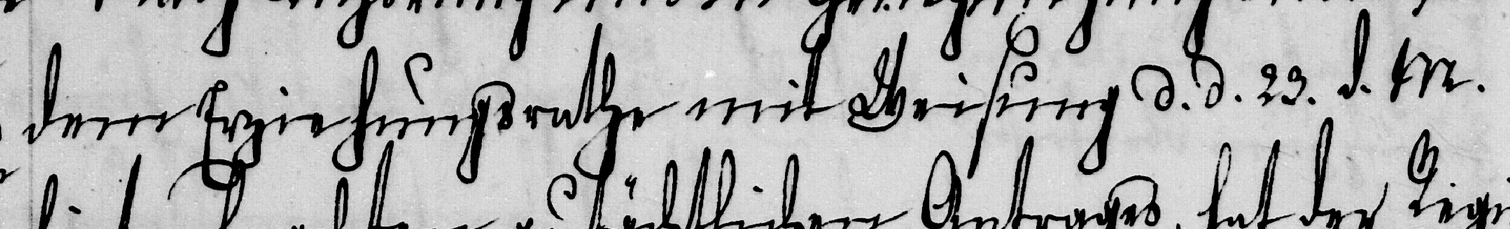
dem Erziehungsrathe mit Weisung d. d. 23. d. M.
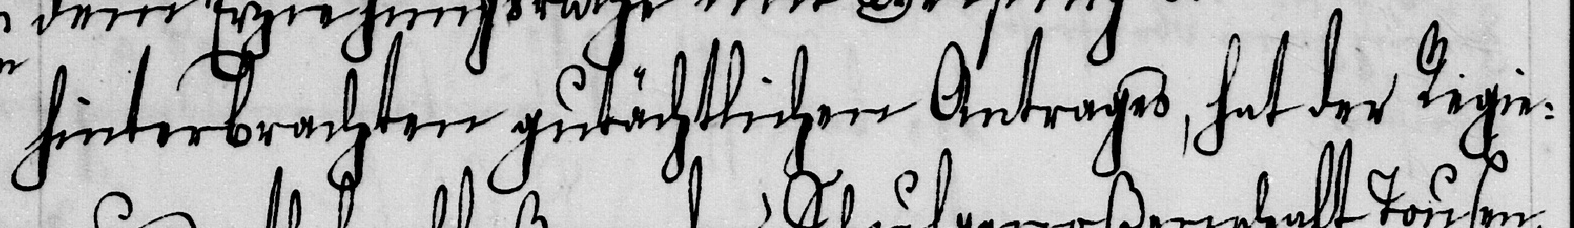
hinterbrachten gutächtlichen Antrages, hat der Regie¬
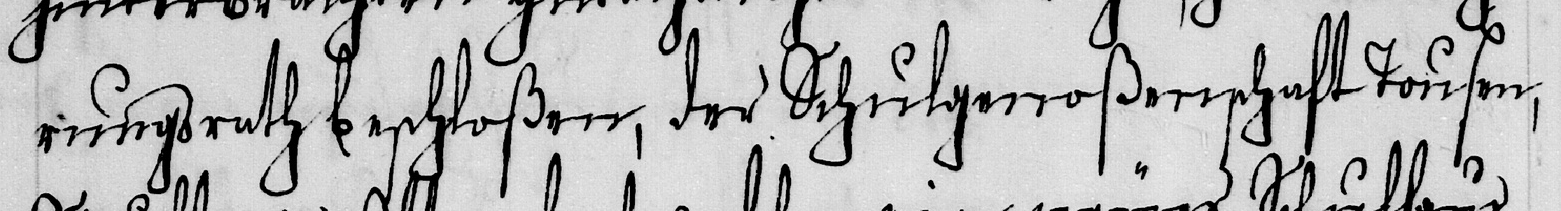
rungsrath beschloßen, der Schulgenoßenschaft Tousen,
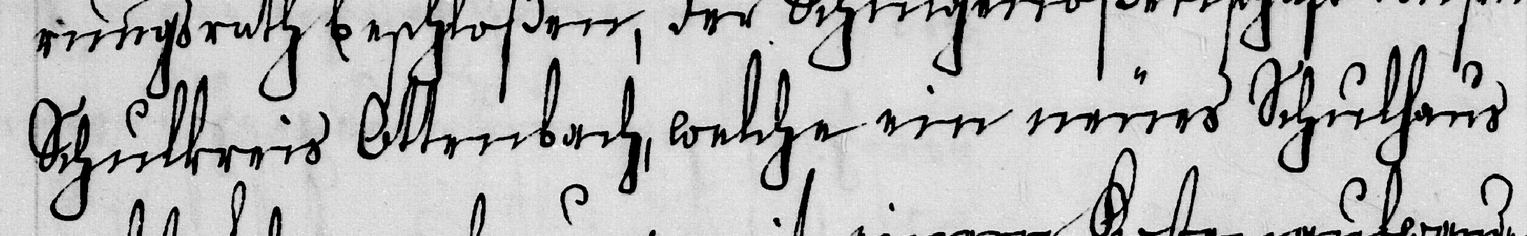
Schulkreis Ottenbach, welche ein neues Schulhaus
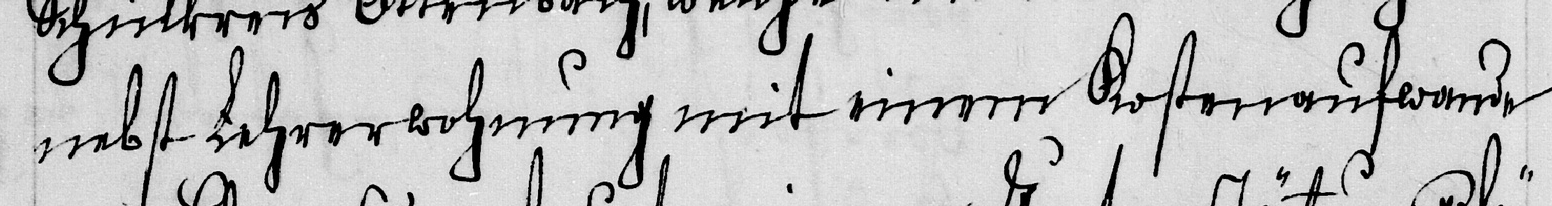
nebst Lehrerwohnung mit einem Kostenaufwande
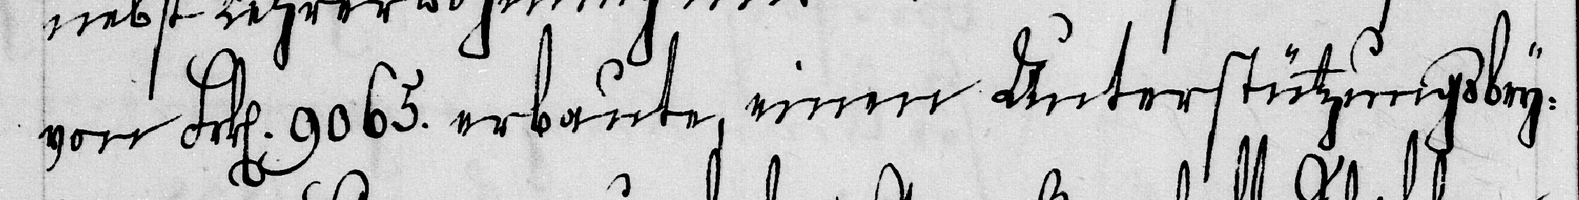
von Frk[en]. 9065. erbaute, einen Unterstützungsbey¬
